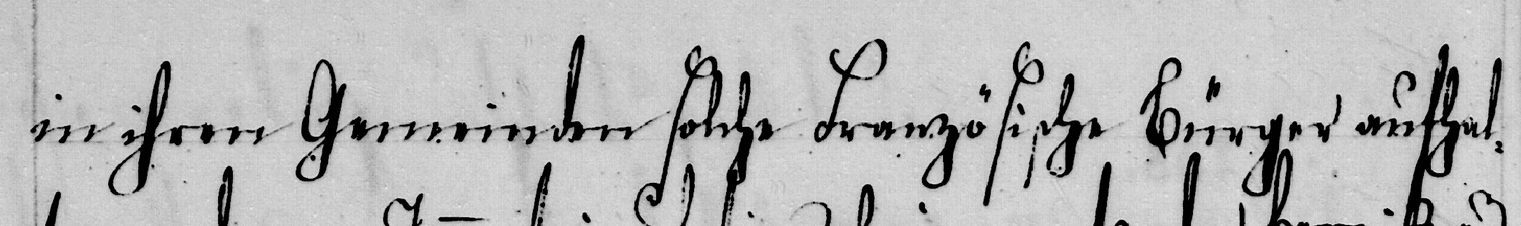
in ihren Gemeinden solche Französische Bürger aufhal¬
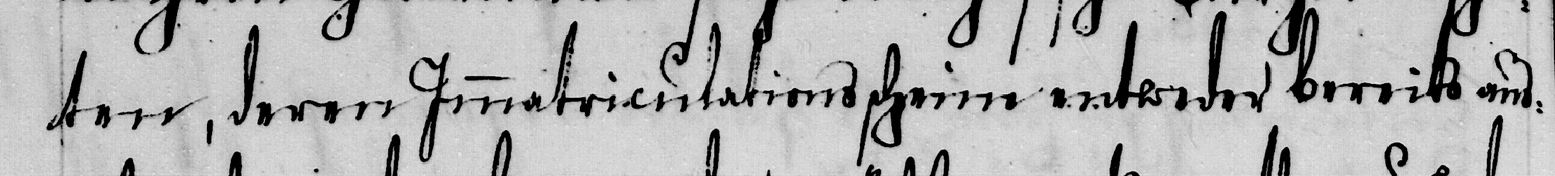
ten, deren Immatriculationsscheine entweder bereits aus¬
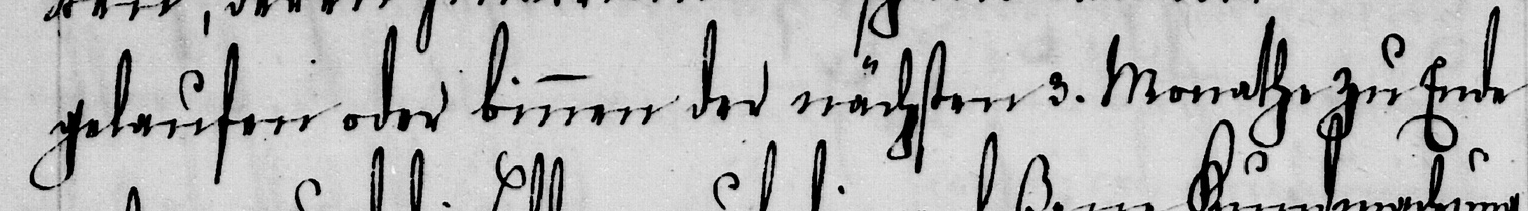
gelaufen oder binnen der nächsten 3. Monathen zu Ende
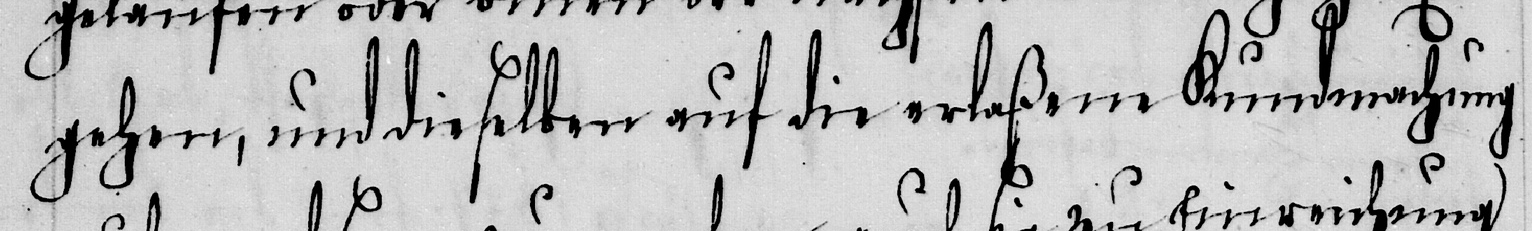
gehen, und dieselben auf die erlaßene Kundmachung
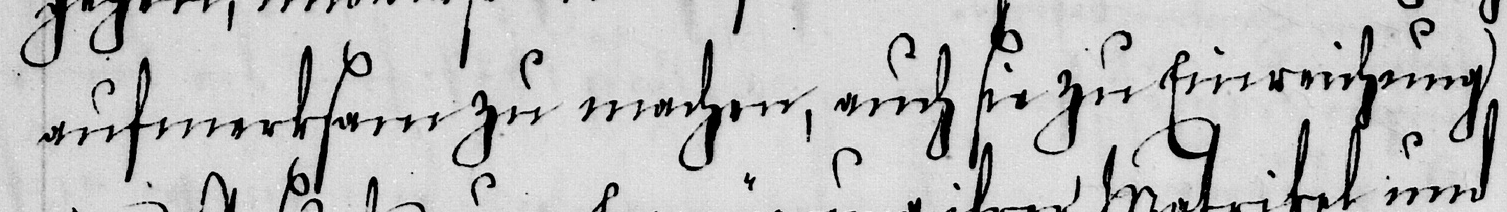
aufmerksam zu machen, auch sie zu Einreichung
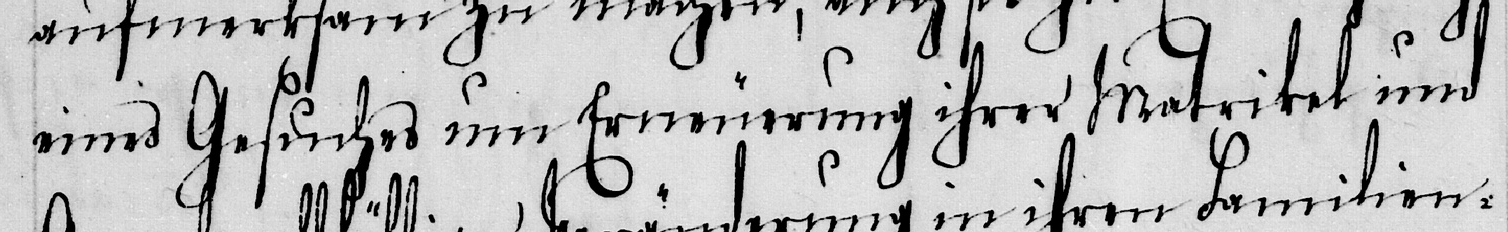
eines Gesuches um Erneuerung ihrer Matrikel und
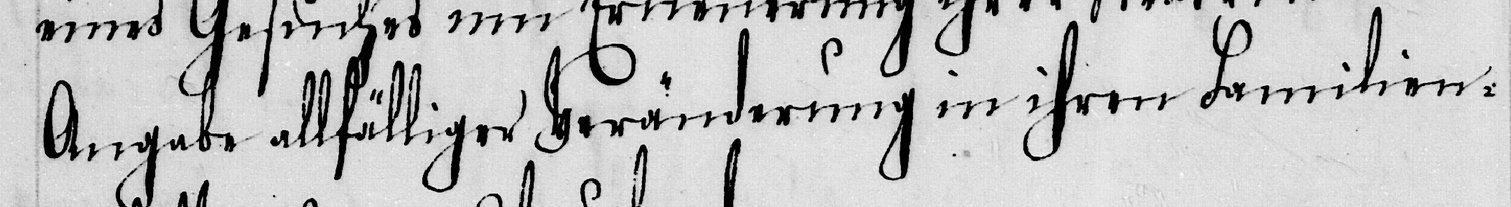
Angabe allfälliger Veränderung in ihren Familien¬
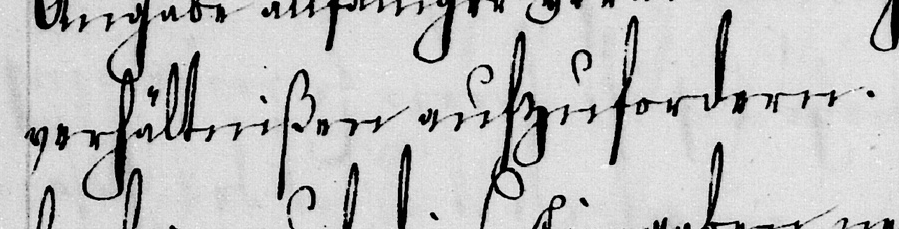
verhältnißen aufzufordern.
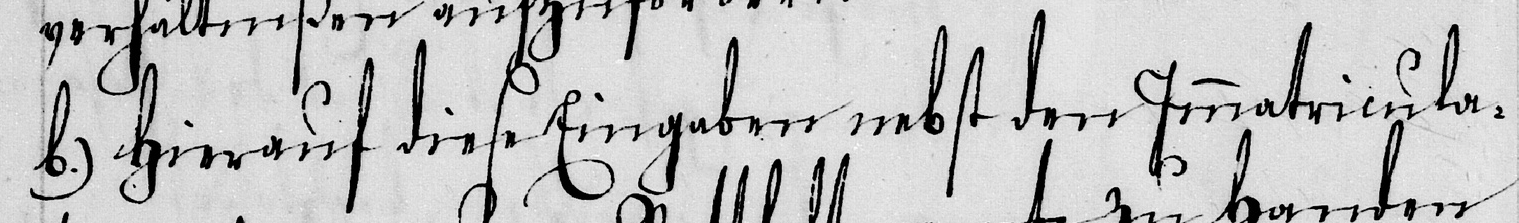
b.) Hierauf diese Eingaben nebst den Immatricula¬
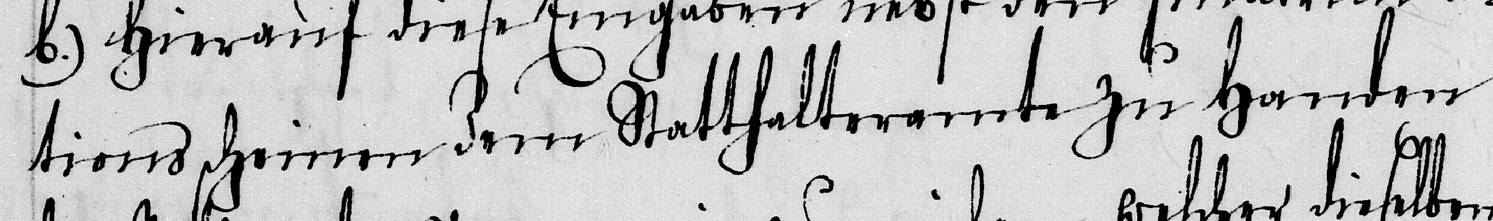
tionsscheinen dem Statthalteramte zu Handen
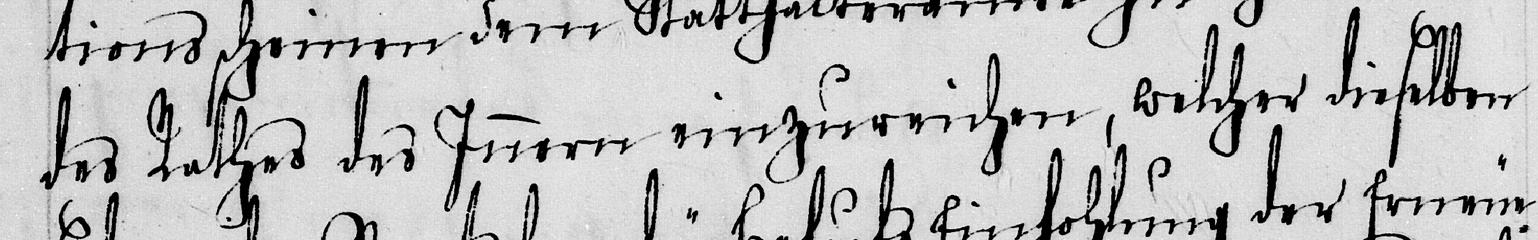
des Rathes des Innern einzureichen, welcher dieselben
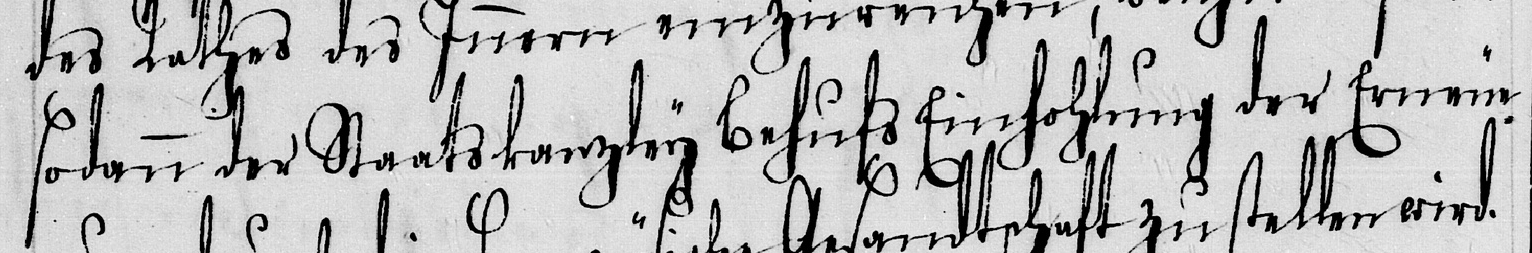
sodann der Staatskanzley Behufs Einhohlung der Erneu¬
